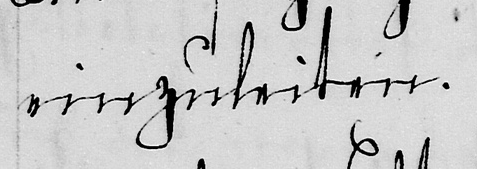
einzuleiten.
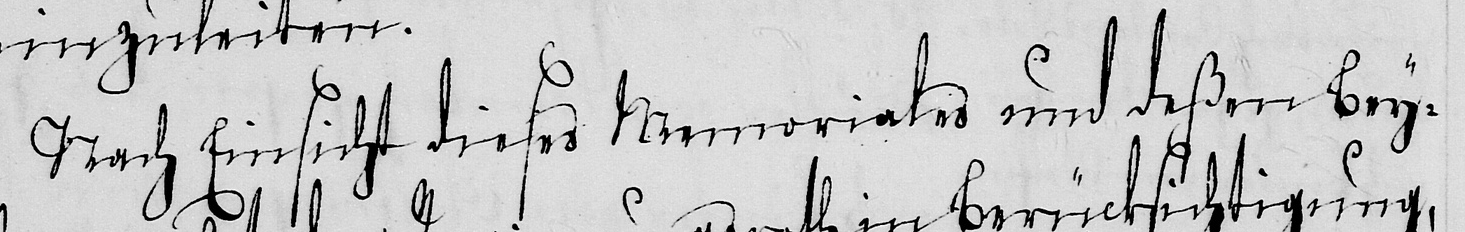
Nach Einsicht dieses Memoriales und deßen Bey¬
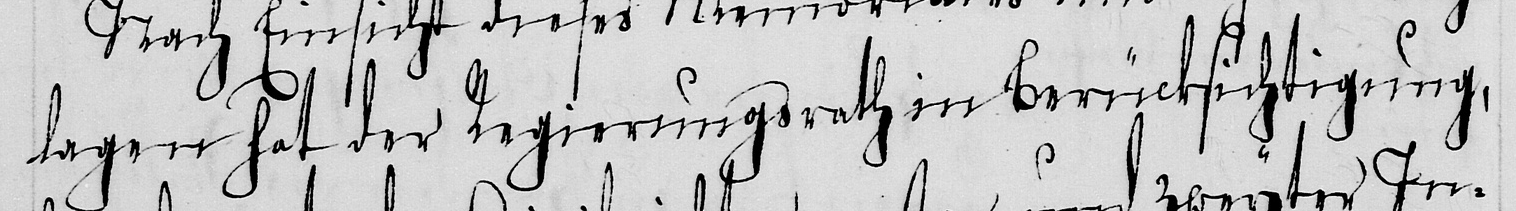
lagen hat der Regierungsrath in Berücksichtigung,
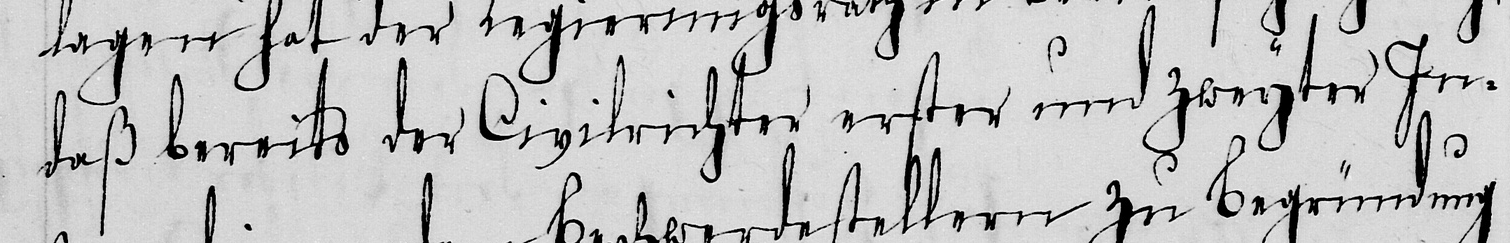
daß bereits der Civilrichter erster und zweyter In¬
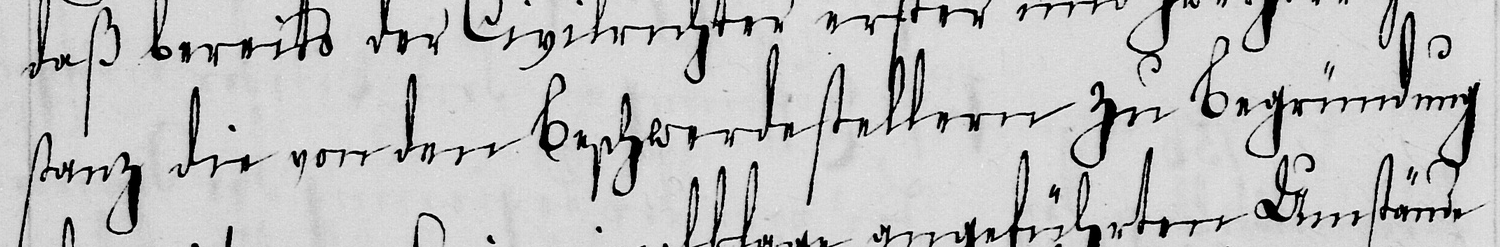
stanz die von den Beschwerdestellern zu Begründung
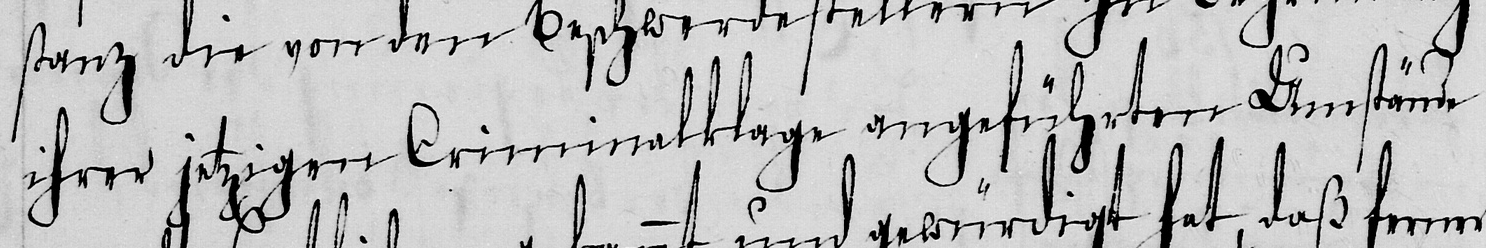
ihrer jetzigen Criminalklage angeführten Umstände
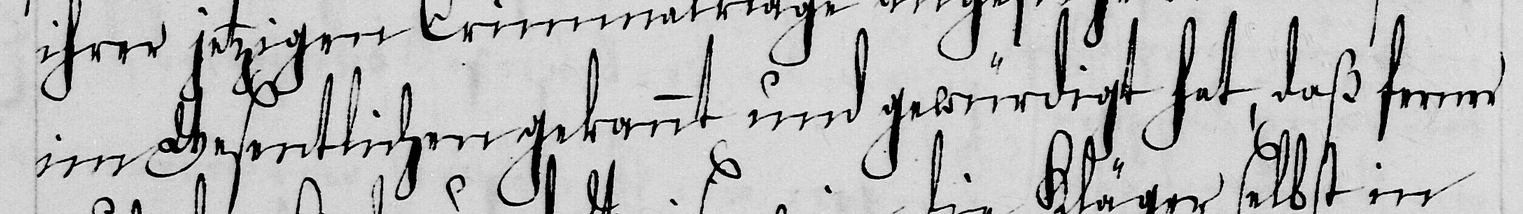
im Wesentlichen gekannt und gewürdigt hat, daß ferner
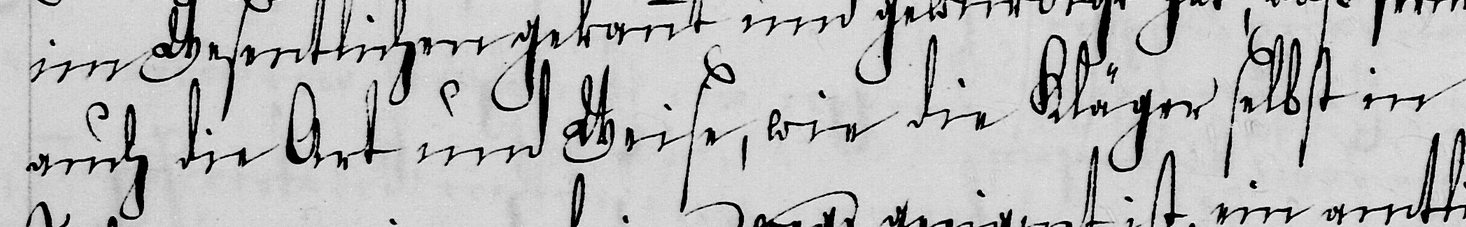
auch die Art und Weise, wie die Kläger selbst in
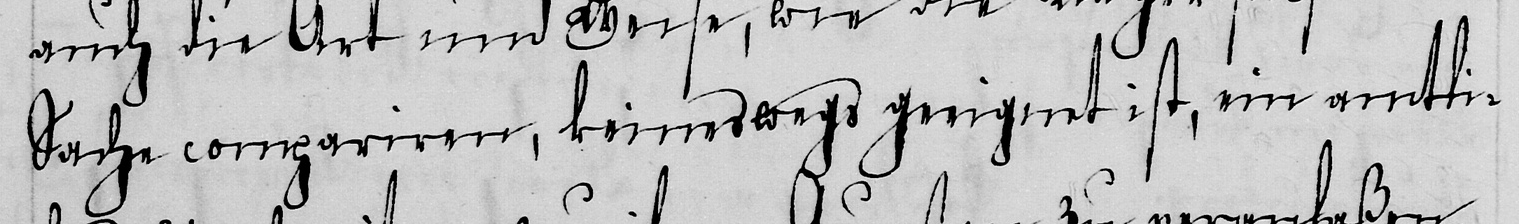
Sache compariren, keineswegs geeignet ist, ein amtli¬
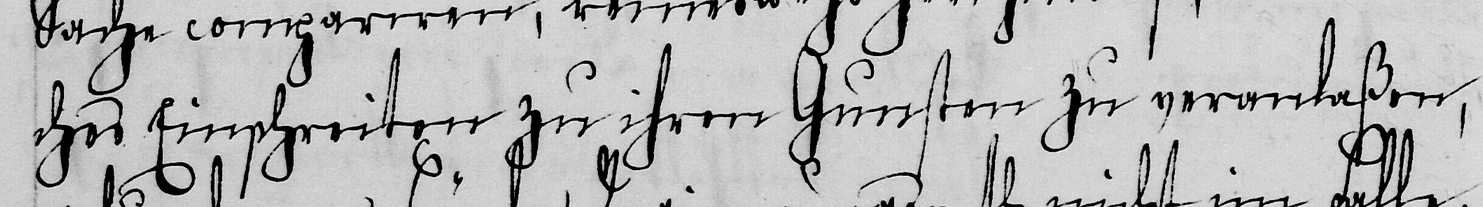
ches Einschreiten zu ihren Gunsten zu veranlaßen,
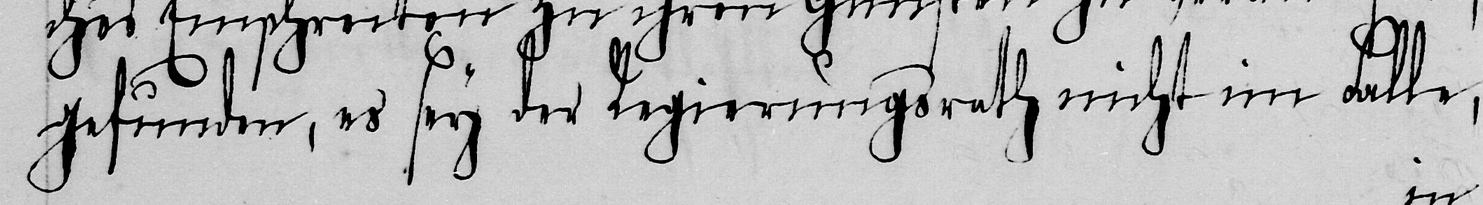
gefunden, es sey der Regierungsrath nicht im Fall¬
